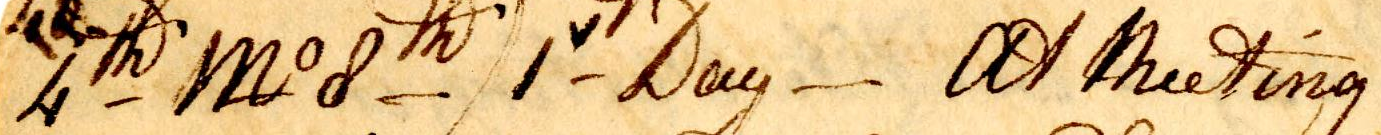4^th M^o 8^th) 1^st Day- At Meeting
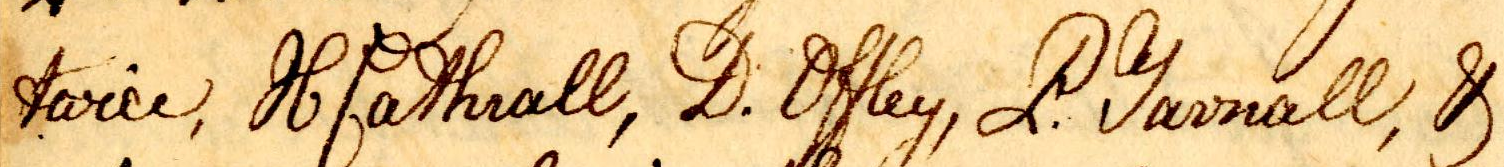twice, H Cathrall, D. Offley, P. Yarnall, &
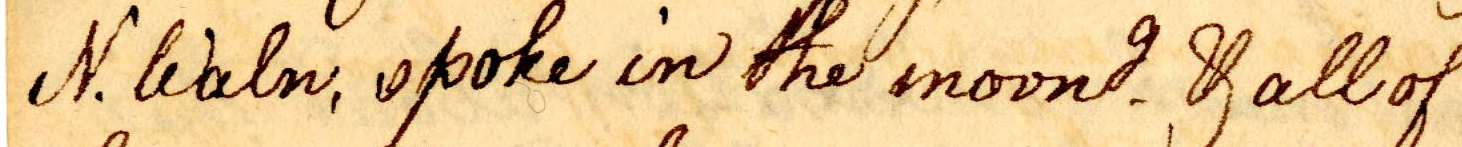N. Waln, spoke in the morn^g. & all of
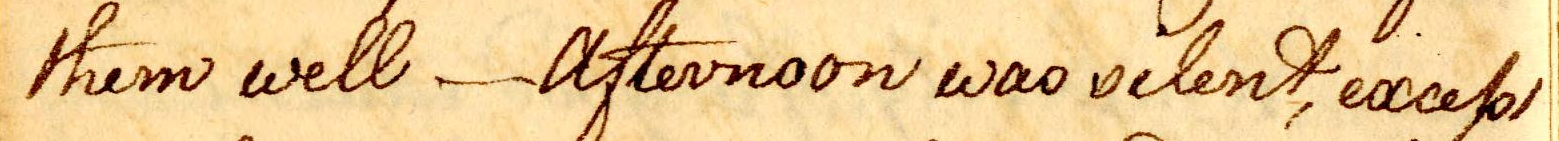them well- Afternoon was silent except
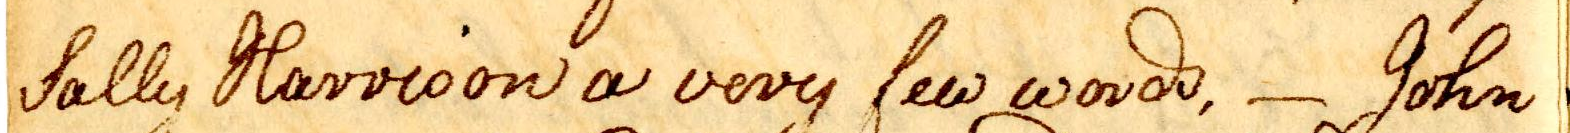Sally Harrison a very few words,- John
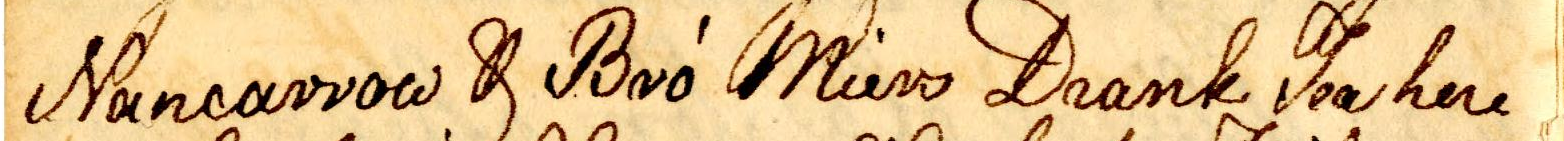Nancarrow & Bro' Miers Drank Tea here
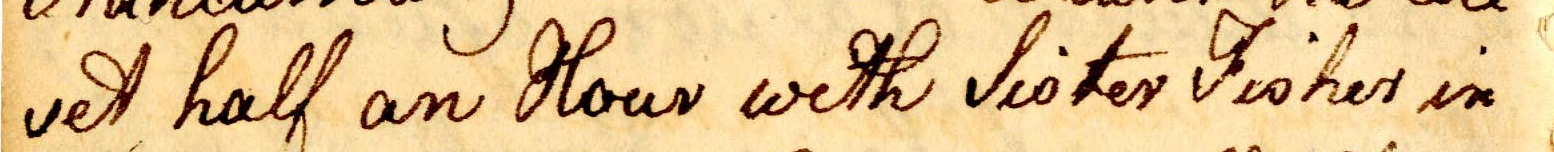set half an Hour with Sister Fishers in
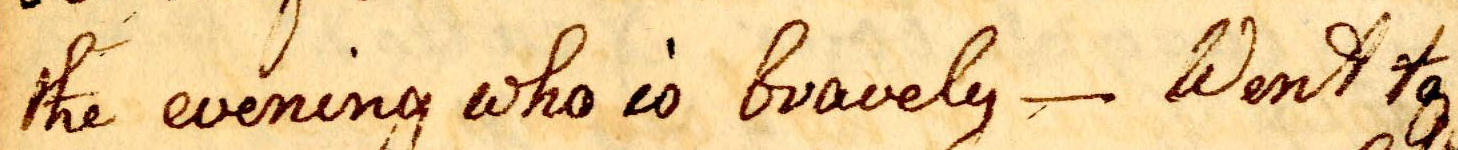the evening who is bravely- Went to
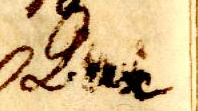Qux
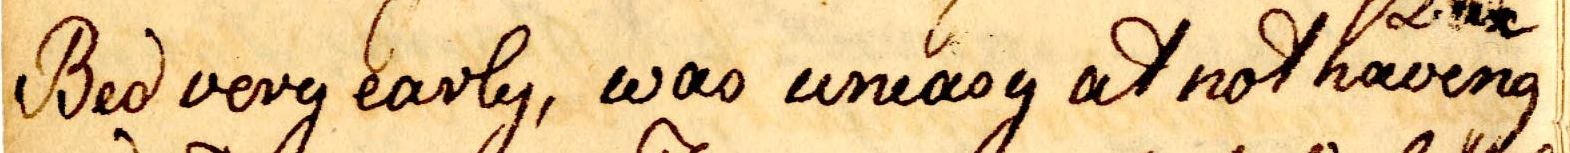Bed very early, was uneasy at not having
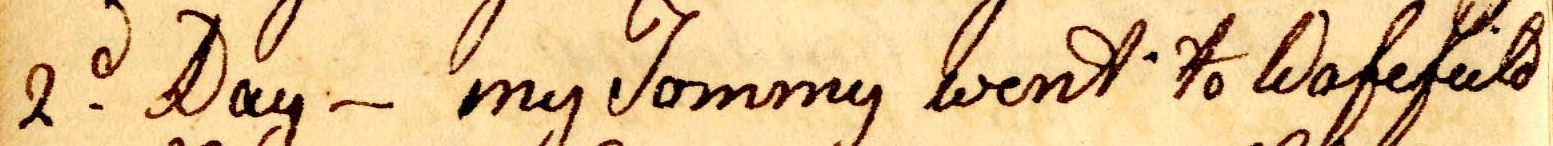2^d. Day- my Tommy went to Wafefeild
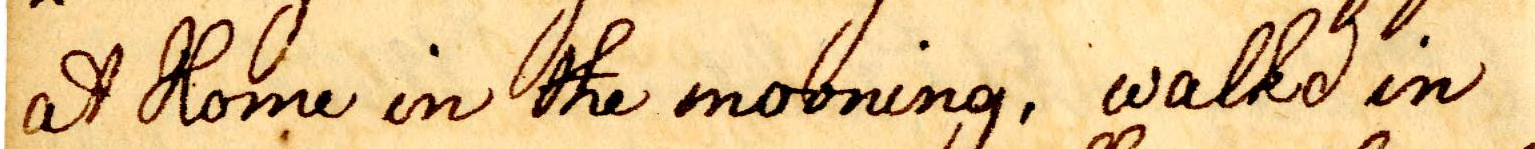at Home in the morning, walkd in
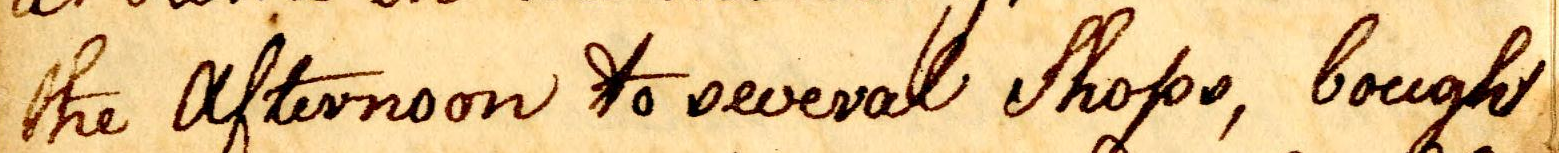the Afternoon to several Shops, bought
